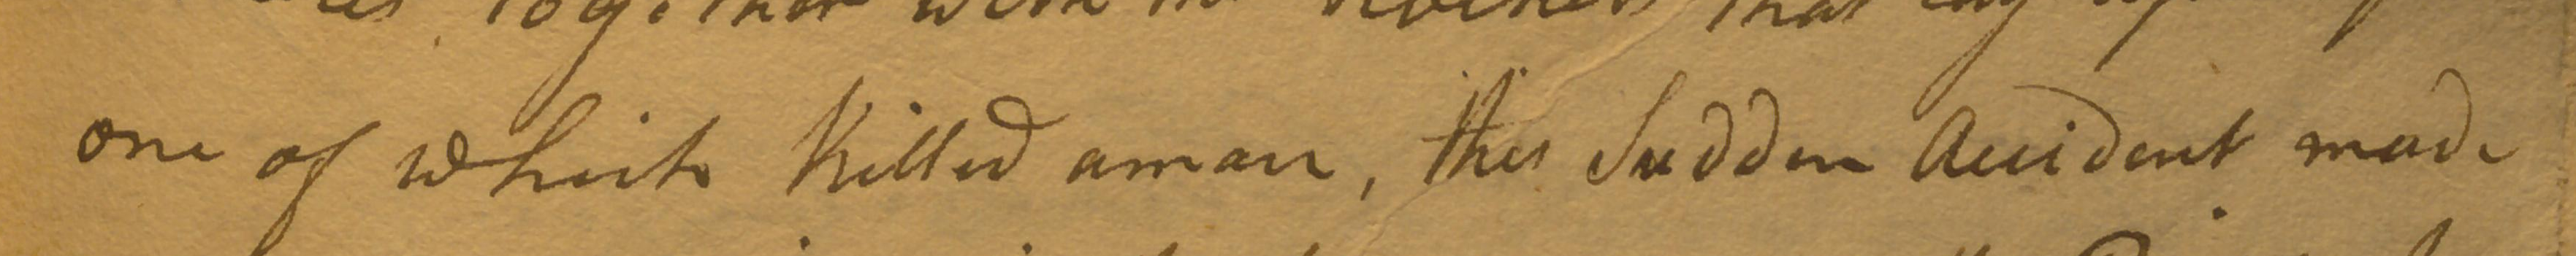one of which Killed a man, this Sudden Accident made
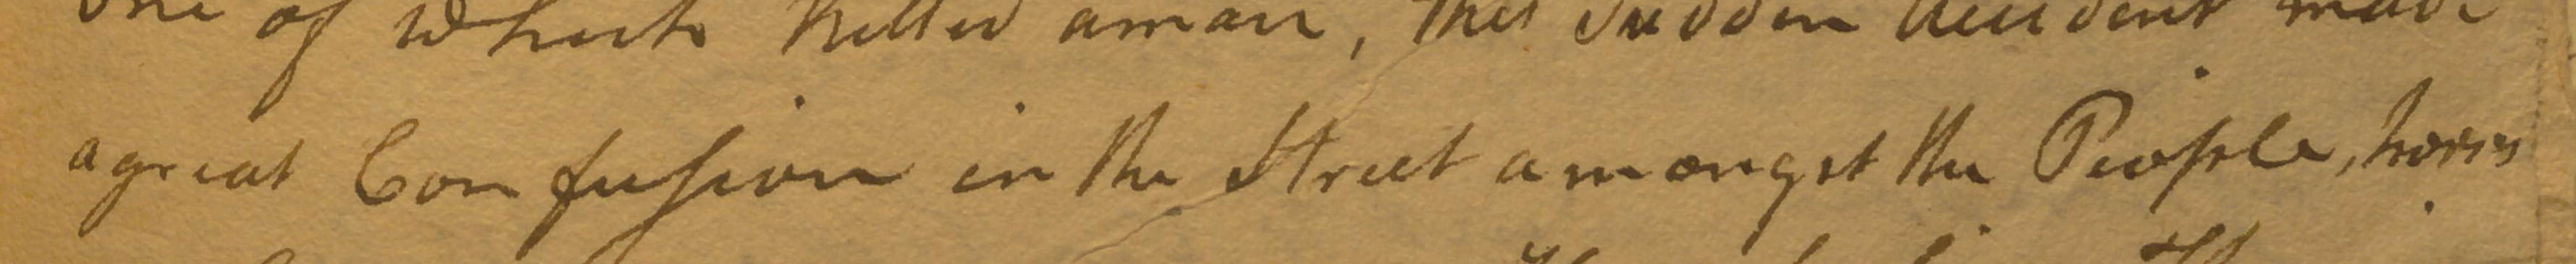agreat Confusion in the Street among it the People, horses
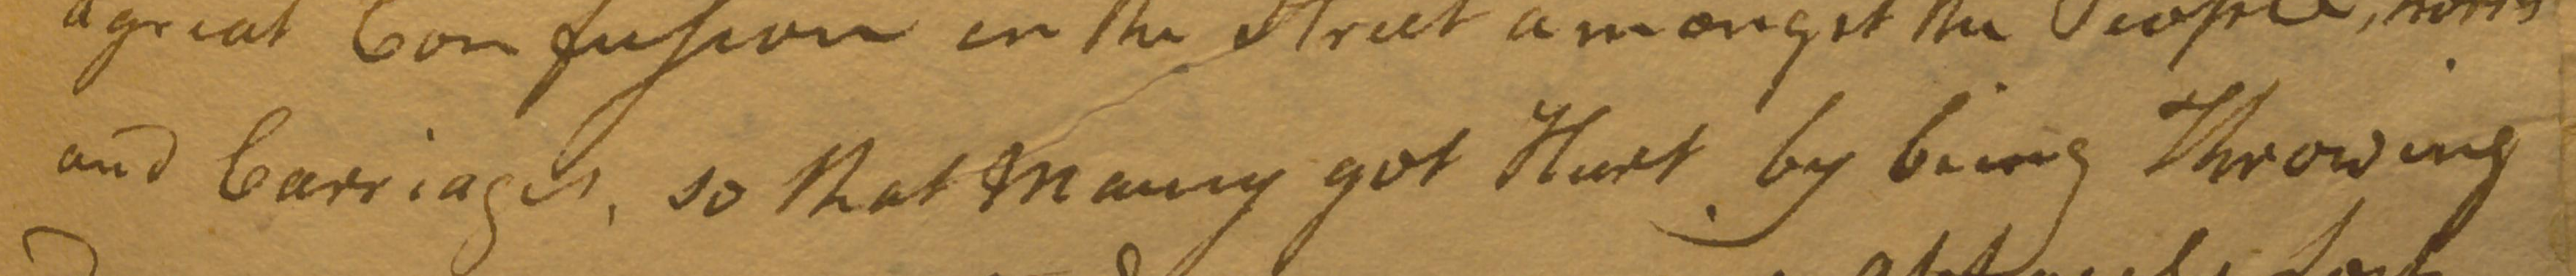and Carriages, so that Many got Hurt by being Throwing
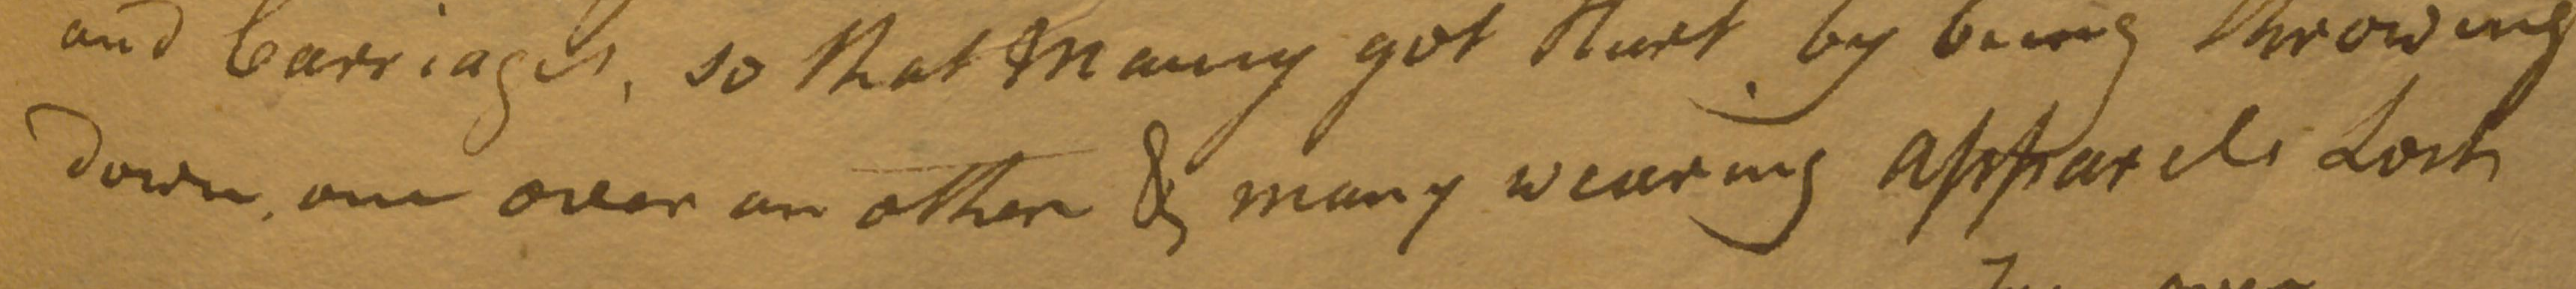down one over an other & many wearing apparels Lost
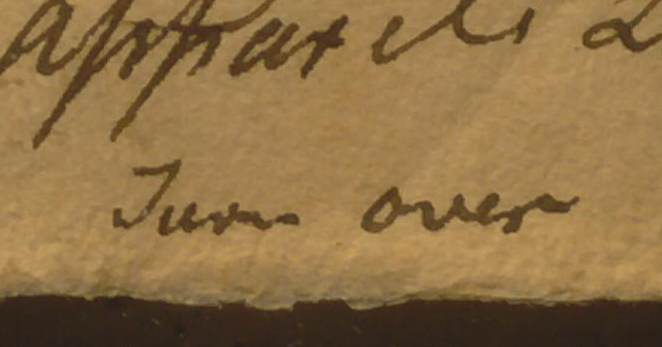Turn over
